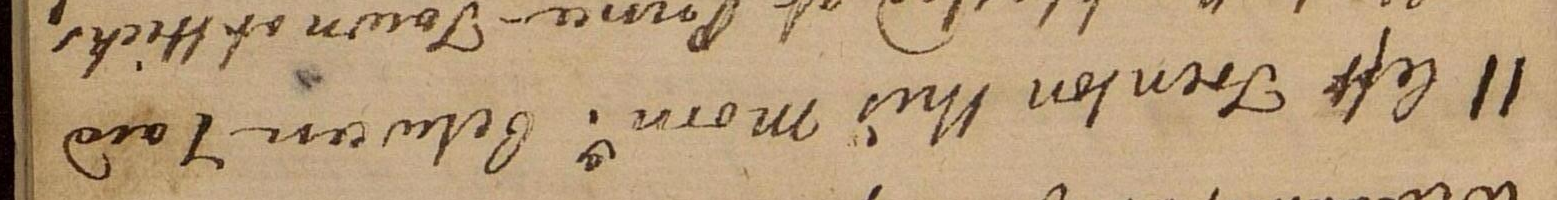11 left Trenton this Morn^g. between 7 and
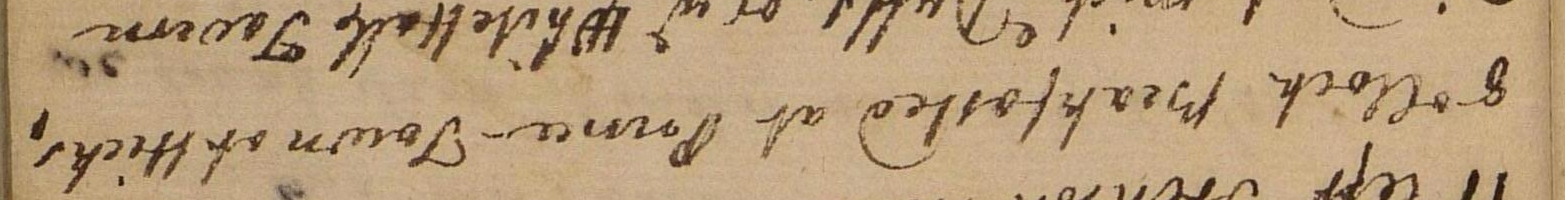8 ^o Clock Breakfasted at Prince-Town at Hicks,
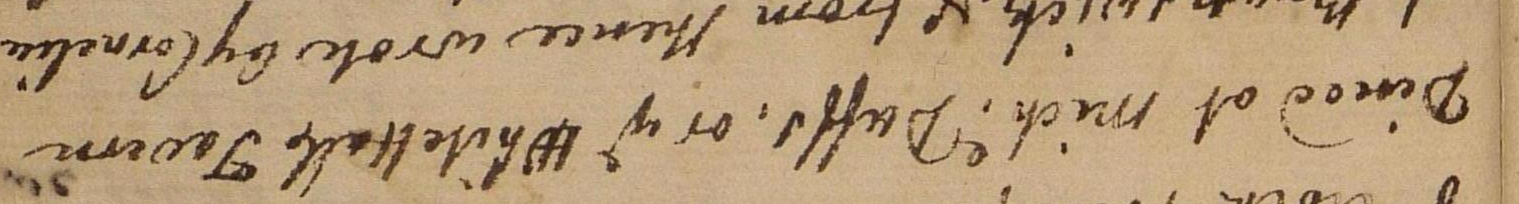Dined at Mich^l. Duffs. or y^e White Hall Tavern^s
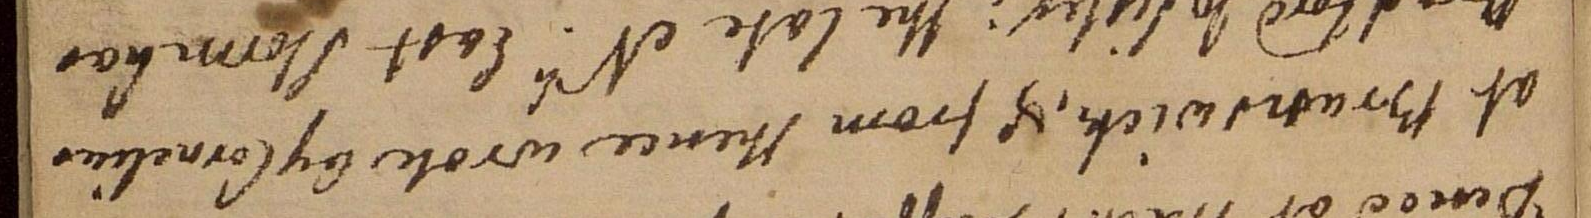at Brunswick, & from thence wrote by Cornelius
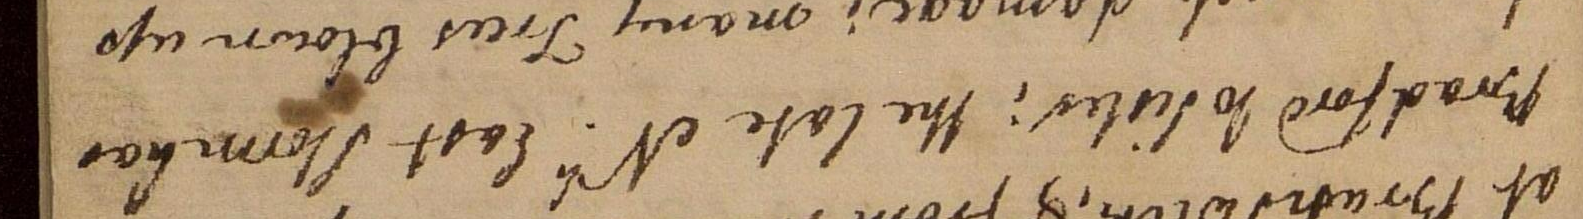Bradford to Sister; the late N^h. East Storm has
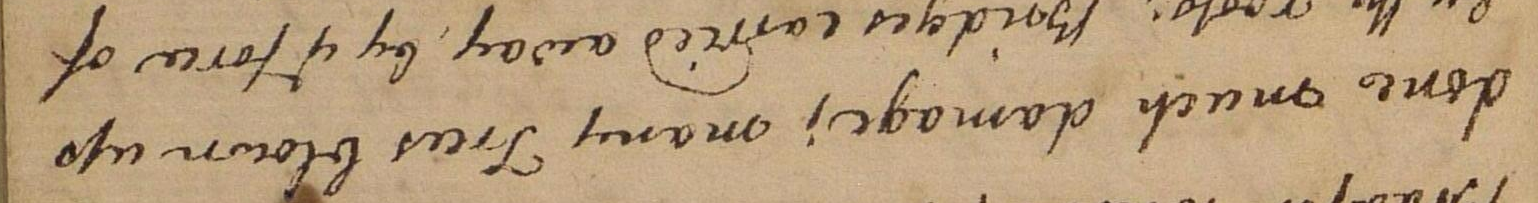done much damage; many Trees blown up
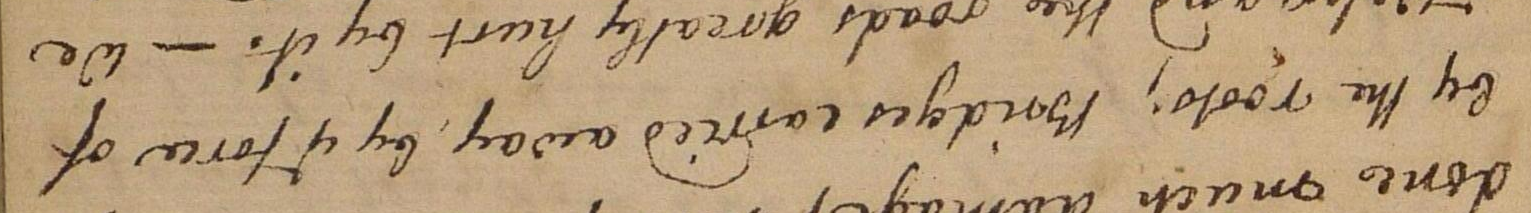by the roots; Bridges carried by y^e force of
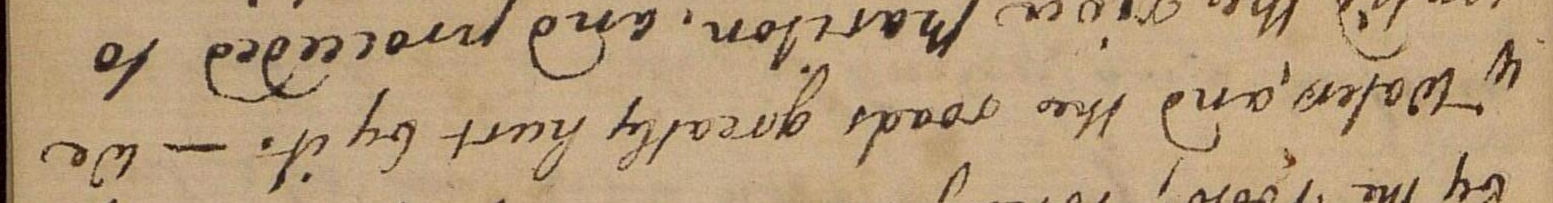y^e Waters, and the roads greatly hurt by it. - We
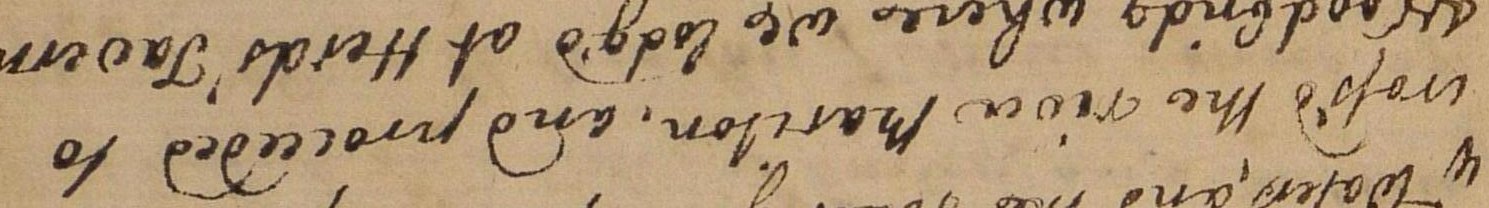cross'd the river Bariton, and proceeded to
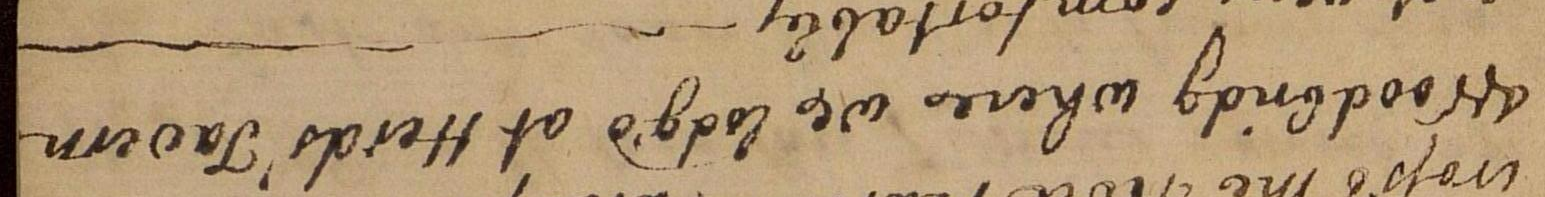Woodbridg where we lodg'd at Herds'Tavern
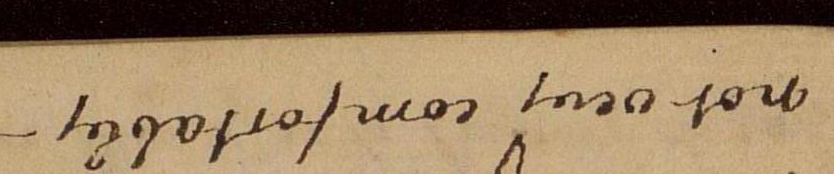not very comfortably-
